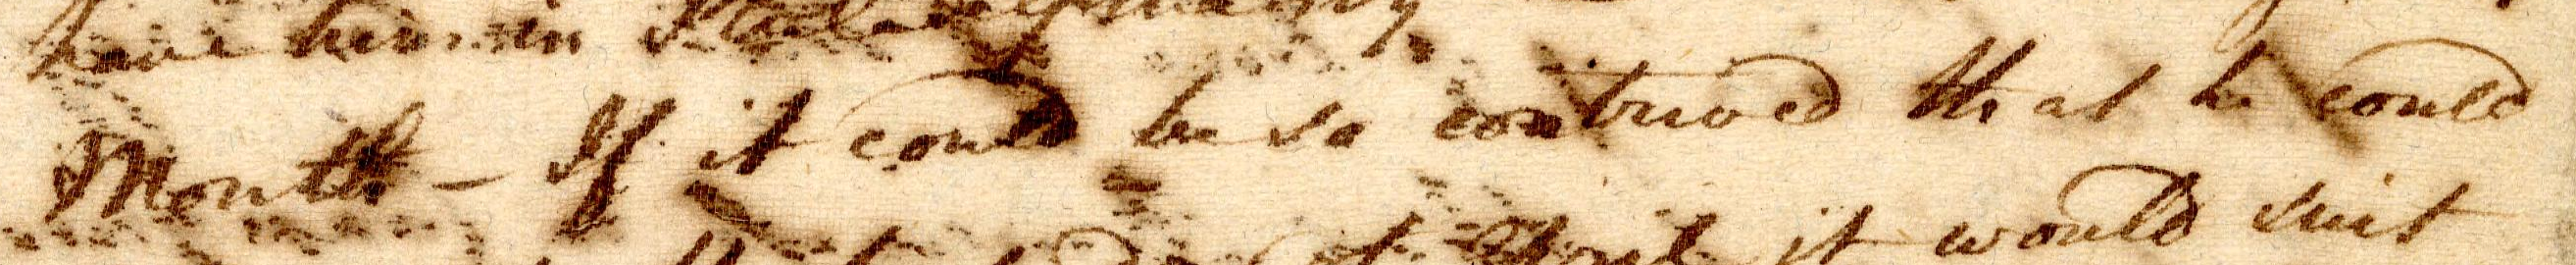Month. If it could be so contrived that he could
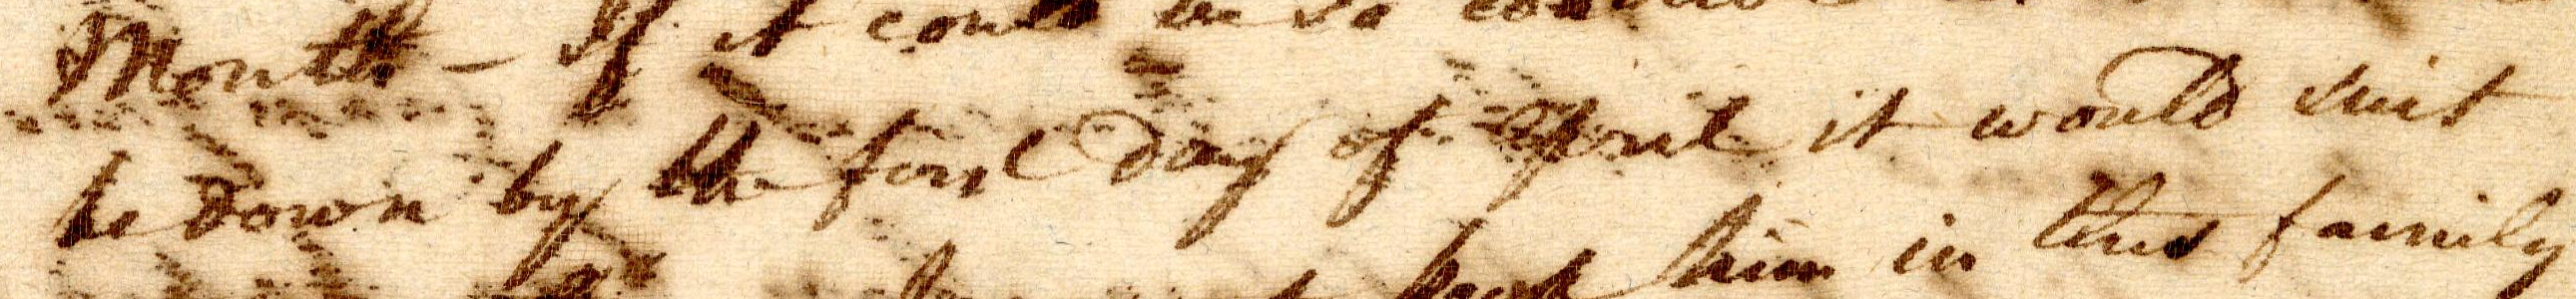be down by the first day of April it would suit
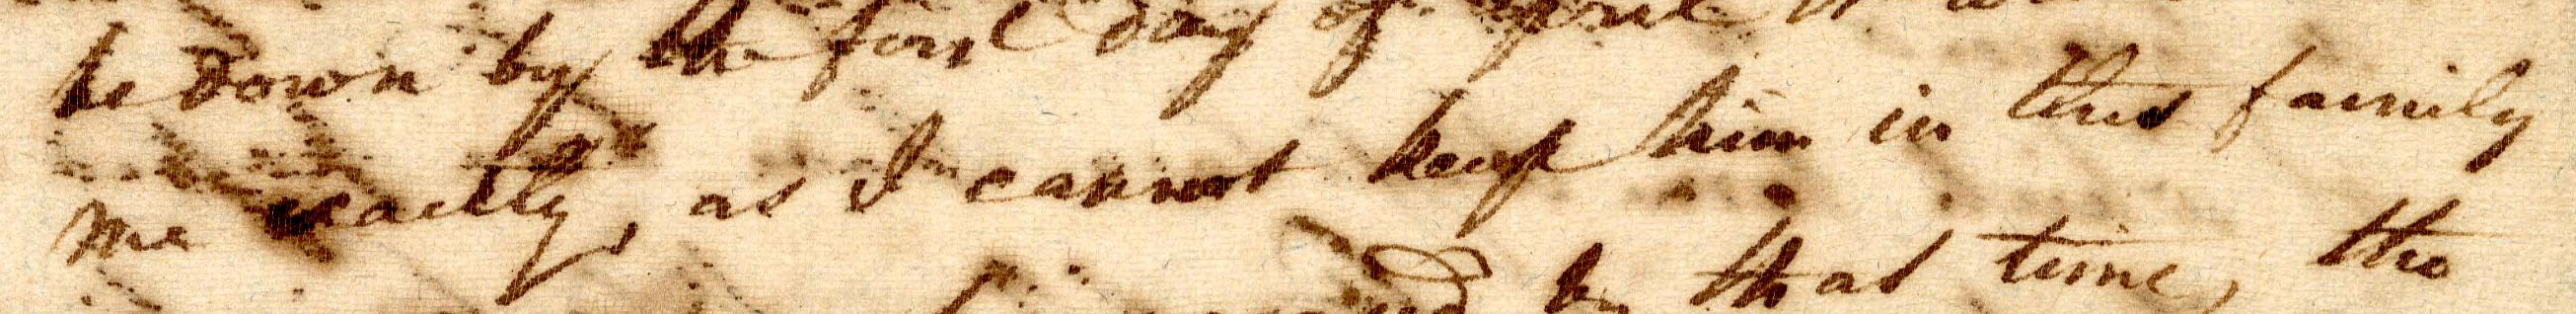me exactly, as I cannot keep him in this family
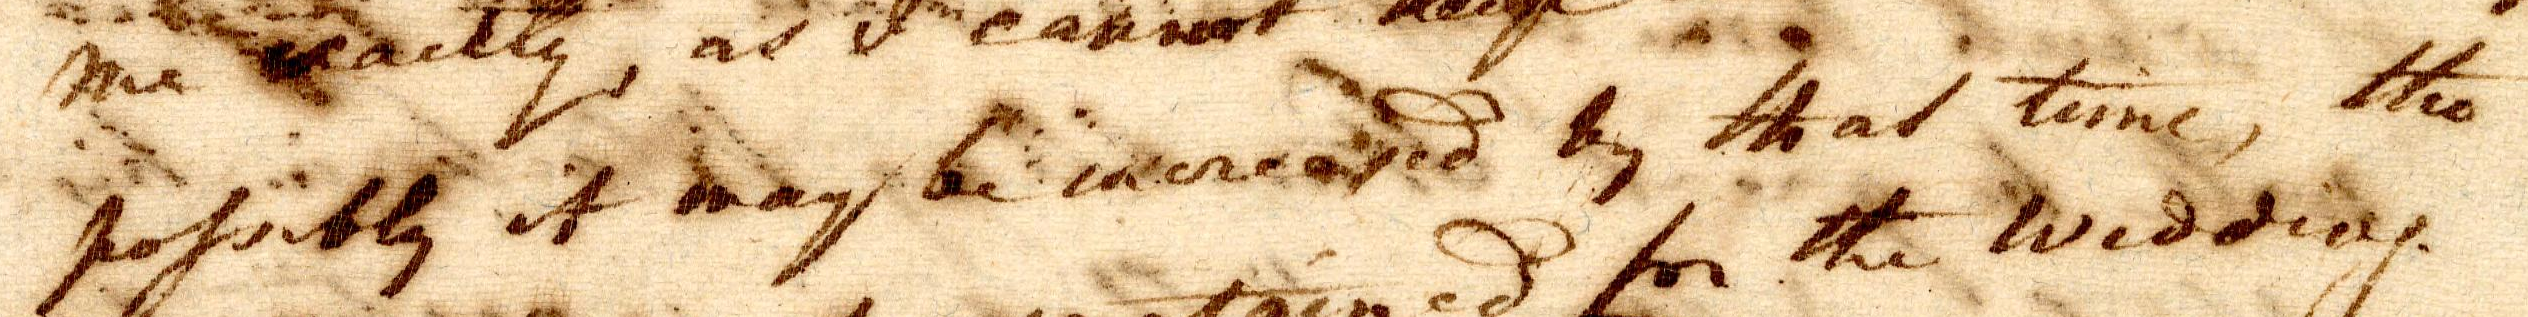possibly it may be increased by that time, tho
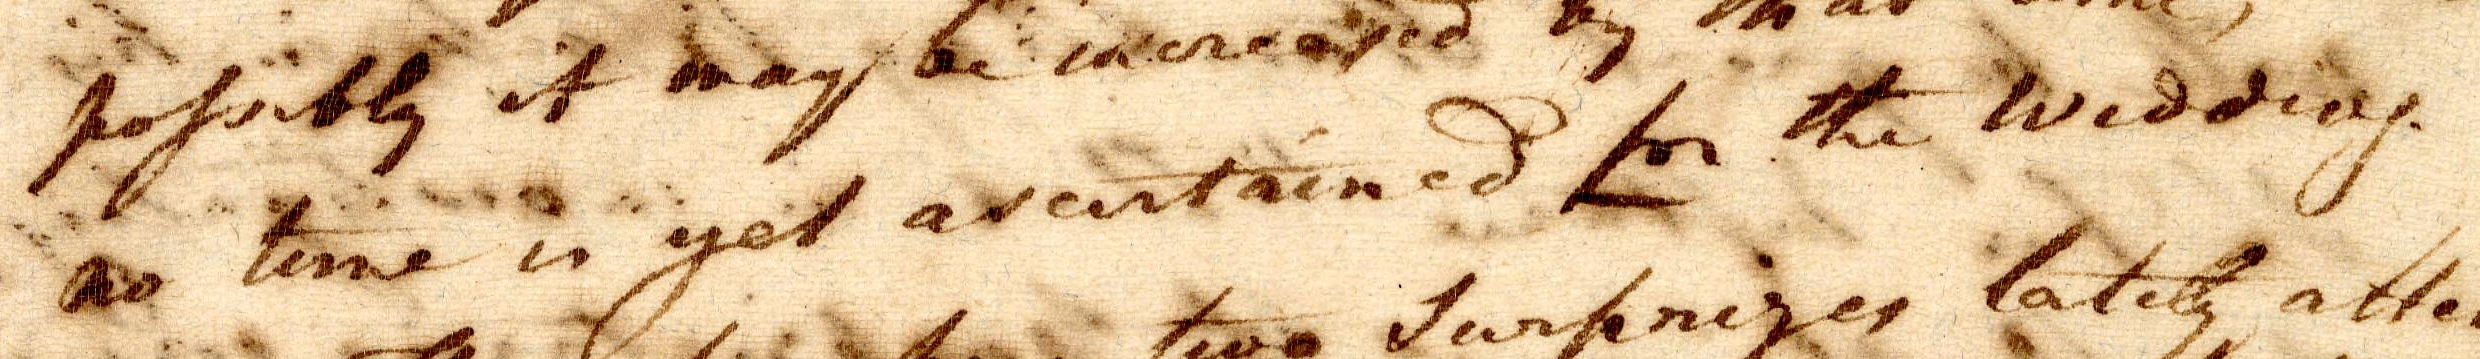no time is yet ascertained for the wedding.
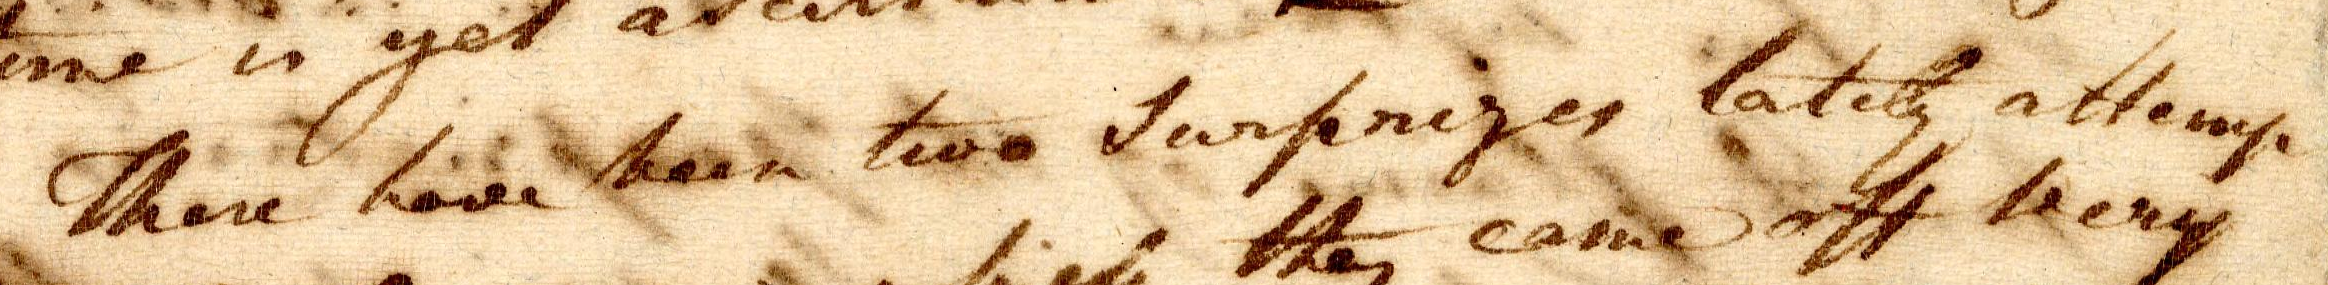There have been two Surprizes lately attemp
